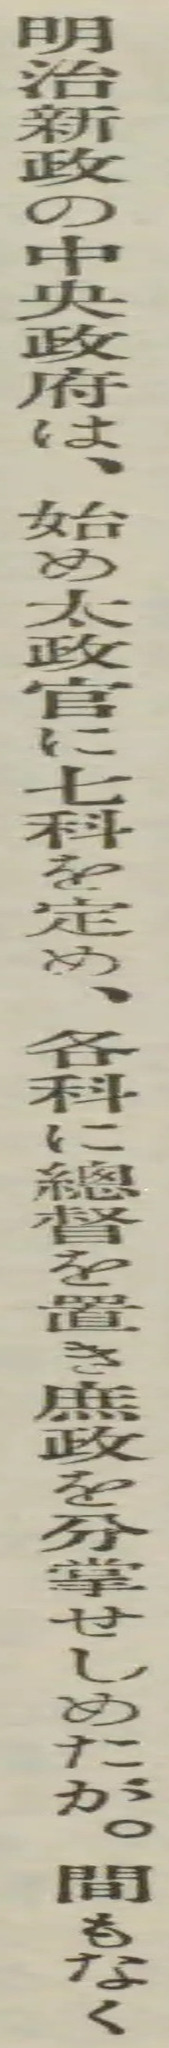明治新政の中央政府は、始め太政官に七科を定め、各科に総督を置き庶政を分掌せしめたが。間もなく
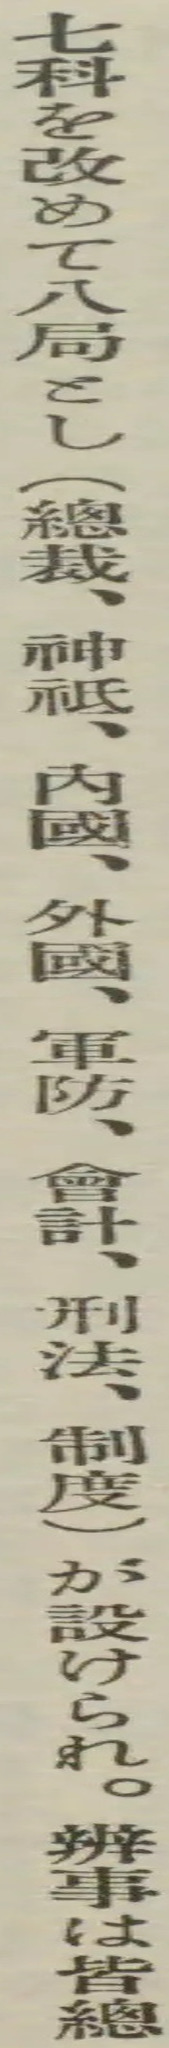七科を改めて八局とし(総裁、神祇、内国、外国、軍防、会計、刑法、制度)が設けられ。辨事は皆総
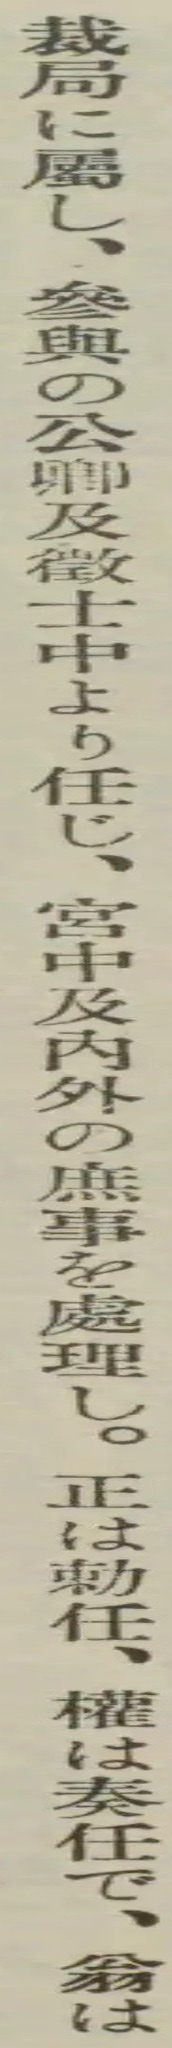裁局に属し、参与の公卿及徴士中より任じ、宮中及内外の庶事を処理し。正は勅任、権は奏任で、翁は
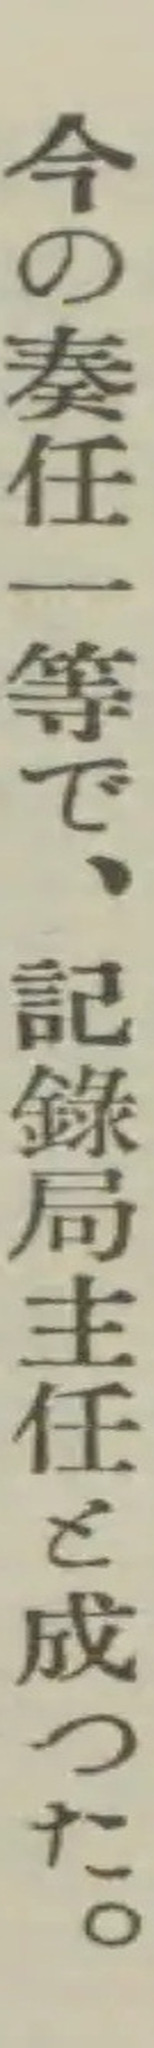今の奏任一等で、記録局主任と成つた。
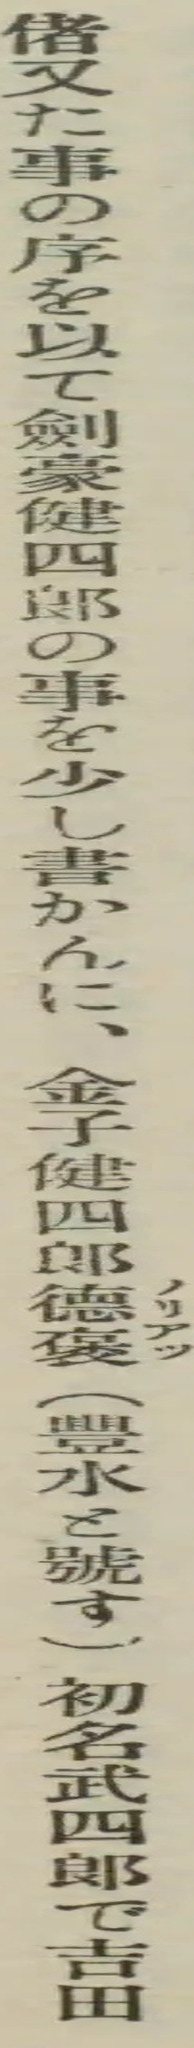偖又た事の序を以て剣豪健四郎の事を少し書かんに、金子健四郎徳褒(豐水と号す)初名武四郎で吉田
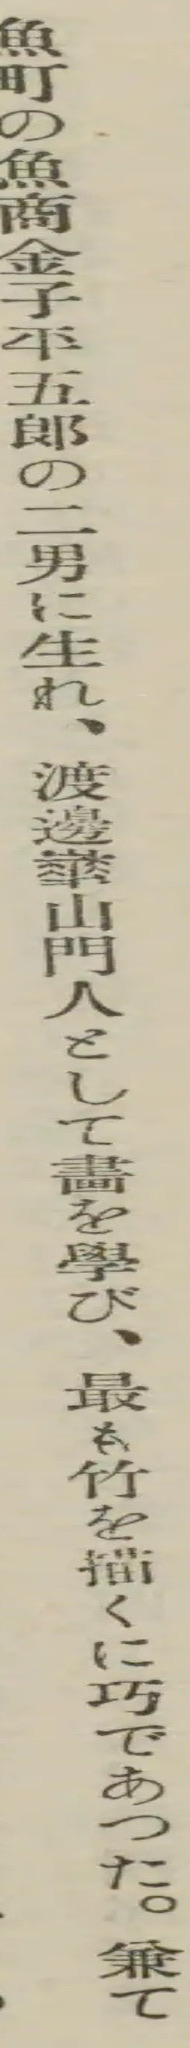魚町の魚商金子平五郎の二男に生れ、渡邊蕐山門人として画を学び、最も竹を描くに巧であつた。兼て
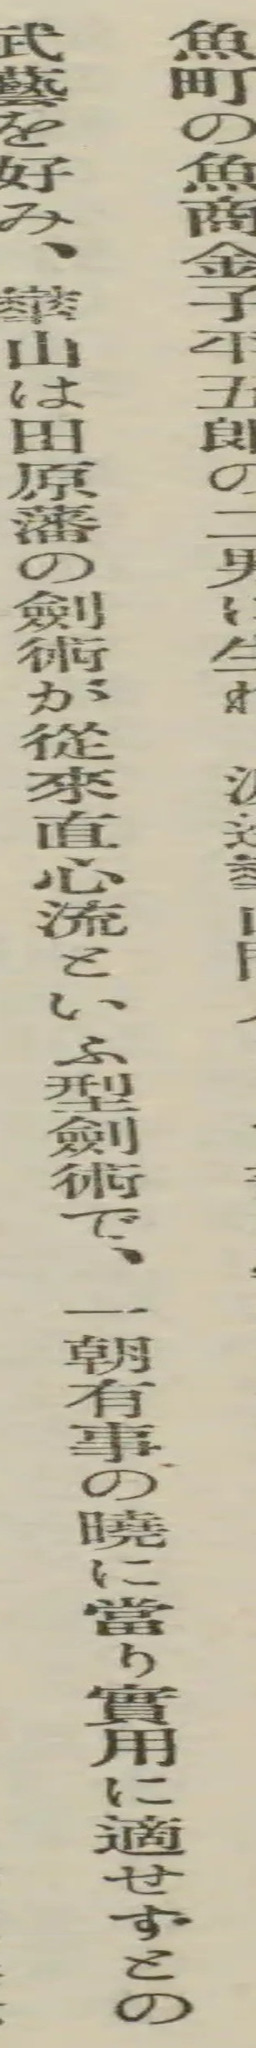武芸を好み、蕐山は田原藩の剣術が従来直心流といふ型剣術で、一朝有事の暁に当り実用に適せずとの
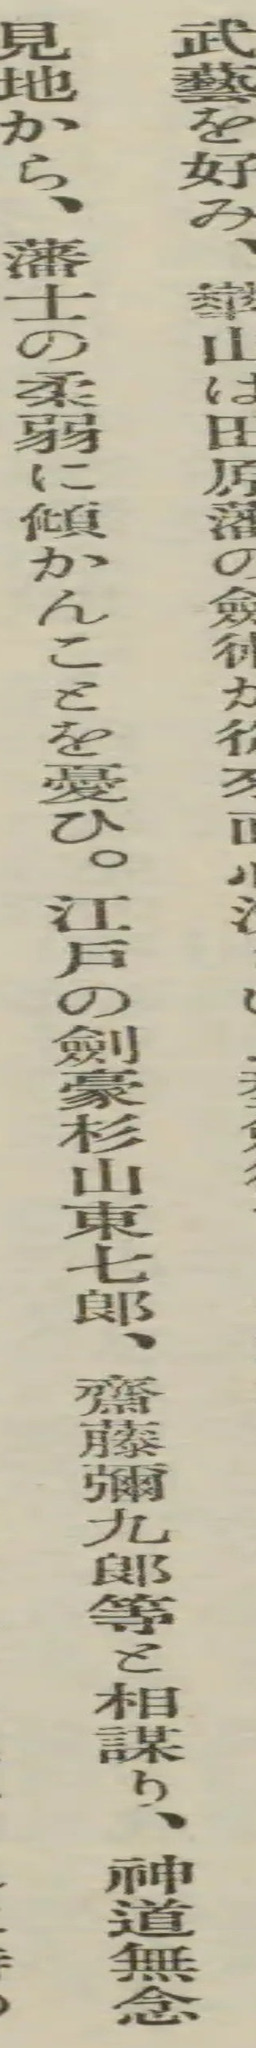見地から、藩士の柔弱に傾かんことを憂ひ。江戸の剣豪杉山東七郎、齋藤彌九郎等と相謀り、神道無念
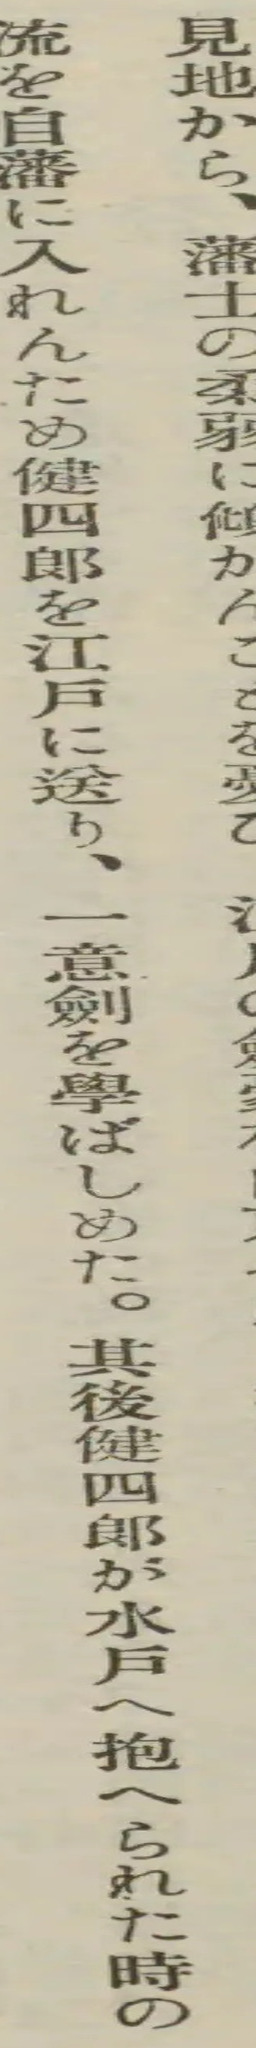流を自藩に入れんため健四郎を江戸に送り、一意剣を学ばしめた。其後健四郎が水戸へ抱へられた時の
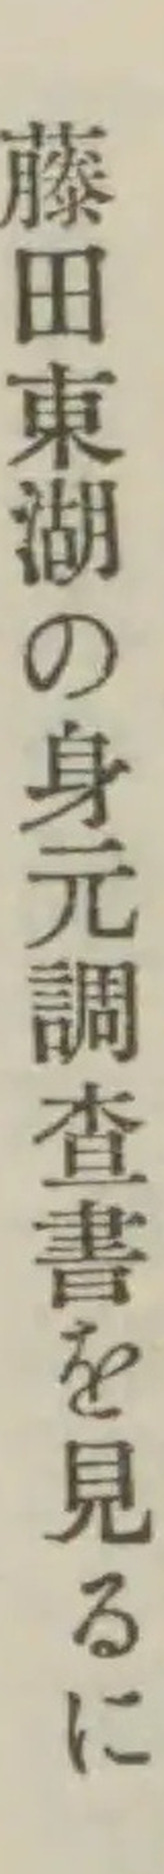藤田東湖の身元調査書を見るに
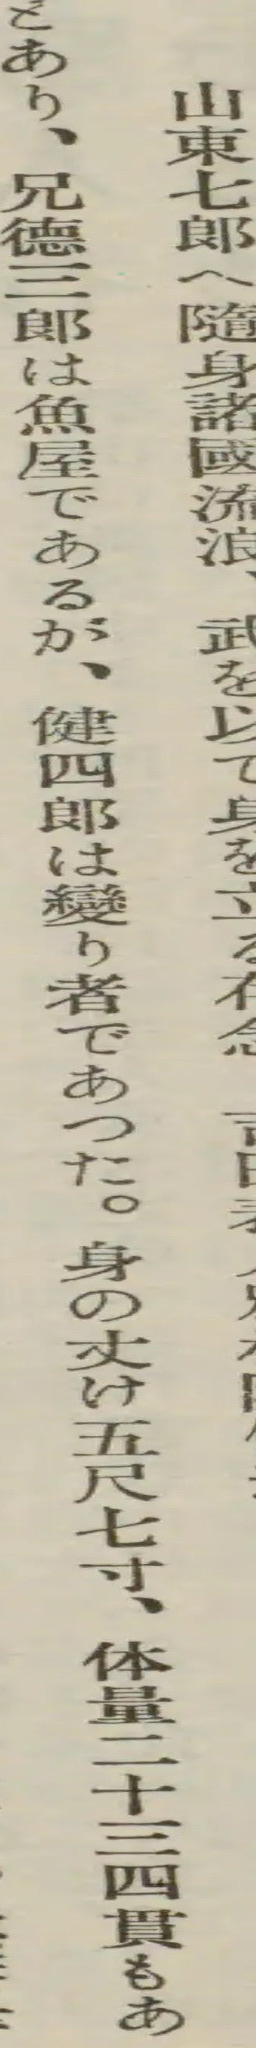とあり、兄徳三郎は魚屋であるが、健四郎は変り者であつた。身の丈け五尺七寸、体重二十三四貫もあ
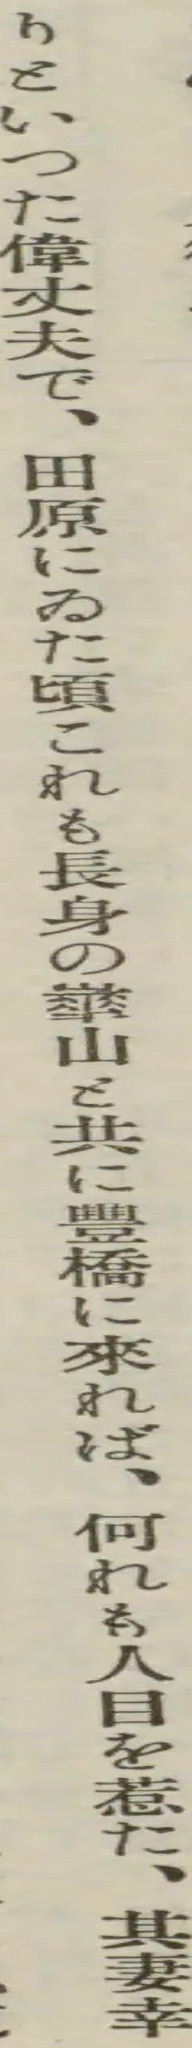りといつた偉丈夫で、田原にゐた頃これも長身の蕐山と共に豊橋に来れば、何れも人目を惹た、其妻幸
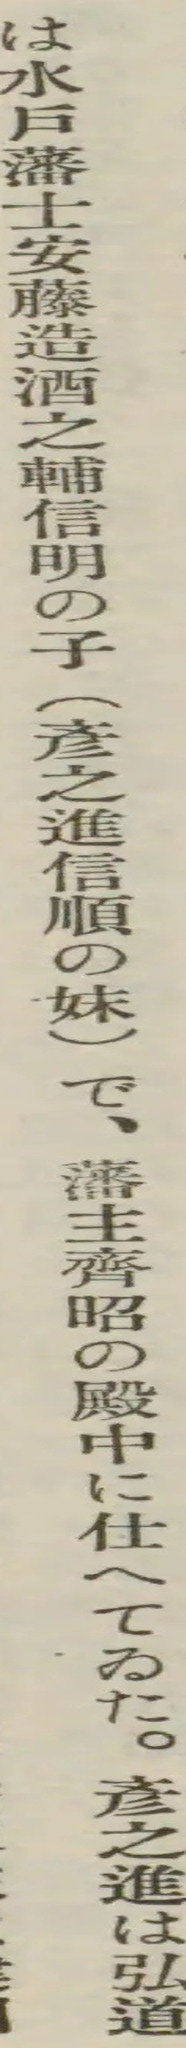は水戸藩士安藤酒造之輔信明の子(彦之進信順の妹)で、藩主齊昭の殿中に仕へてゐた。彦之進は弘道
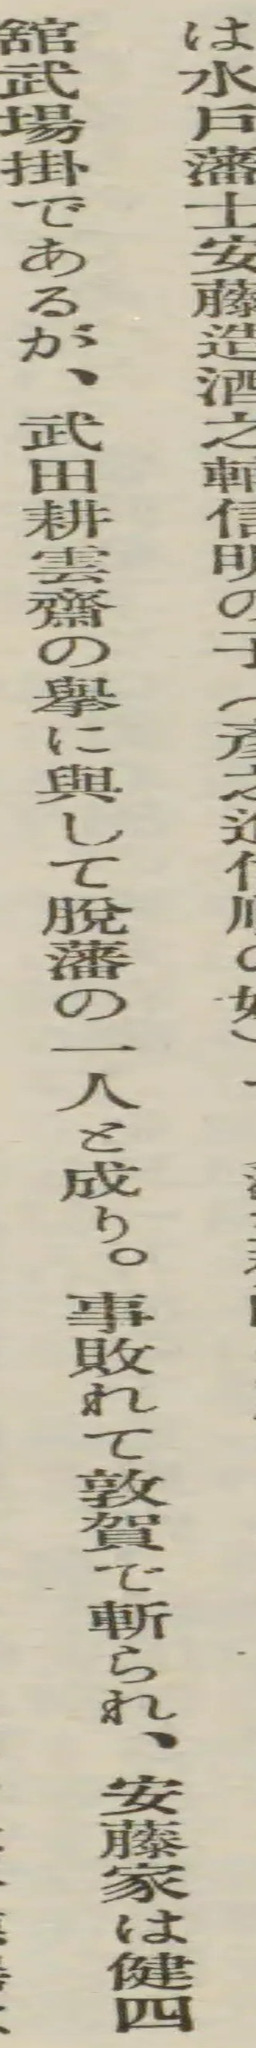館武場掛であるが、武田耕雲齋の挙に与して脱藩の一人と成り。事敗れて敦賀で斬られ、安藤家は健四
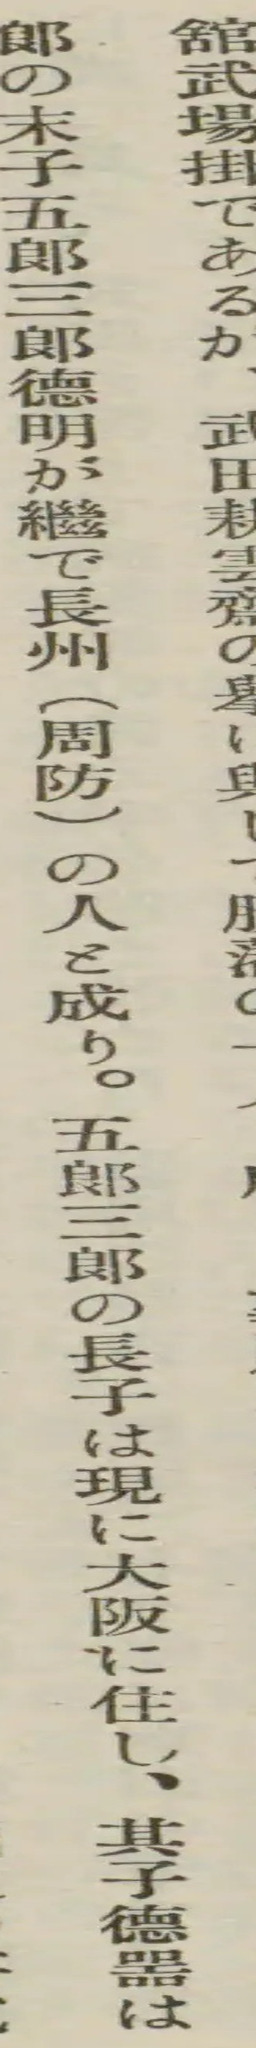郎の末子五郎三郎徳明が継で長州(周防)の人と成り。五郎三郎の長子は現に大阪に住し、其子徳噐は
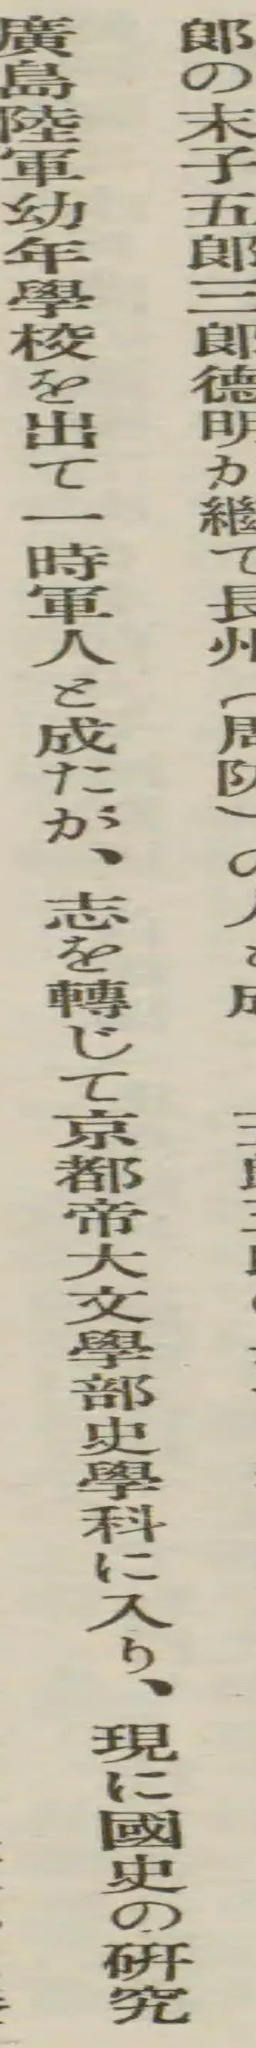広島陸軍幼年学校を出て一時軍人と成たが、志を転じて京都帝大文学部史学科に入り、現に国史の研究
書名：小野湖山翁小伝
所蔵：国立国会図書館 National Diet Library, JAPAN
